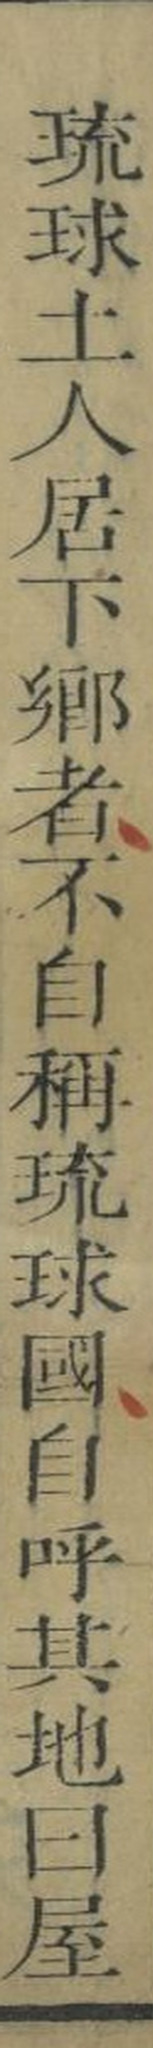琉球土人居下郷者不自称琉球国自呼其地曰屋
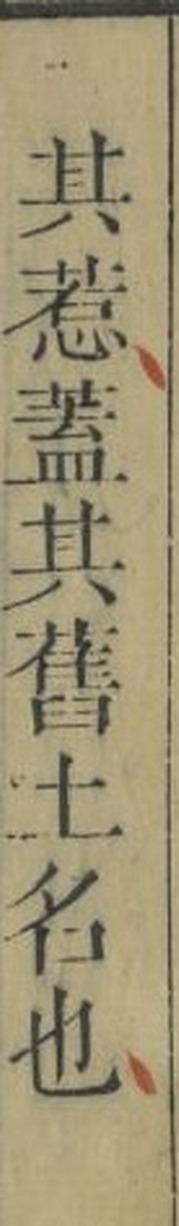其惹蓋其旧土名也

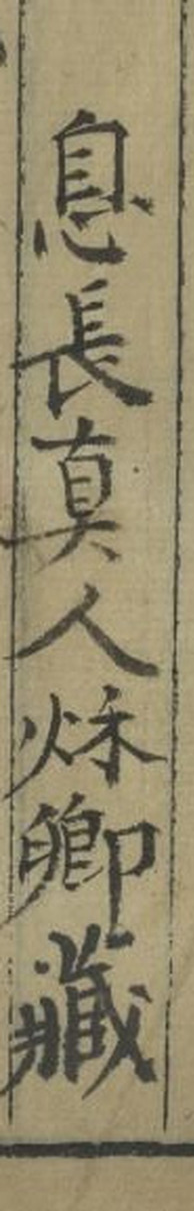息長真人秌卿蔵
